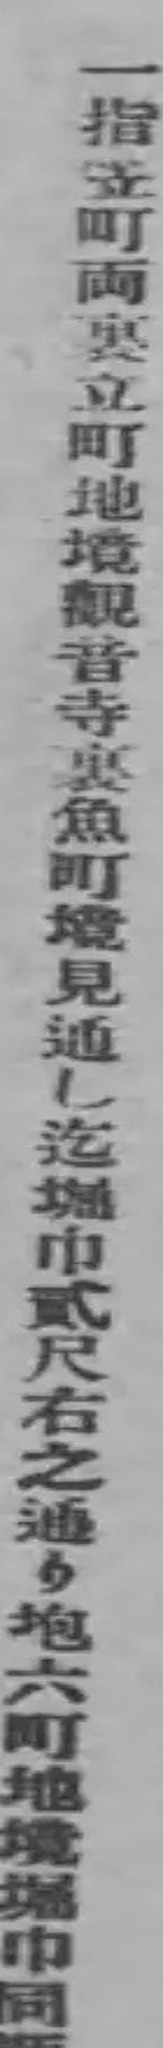一指笠町両裏立町地境観音寺裏魚町境見通し迄堀巾弐尺右之通り垉六町地境堀巾同断
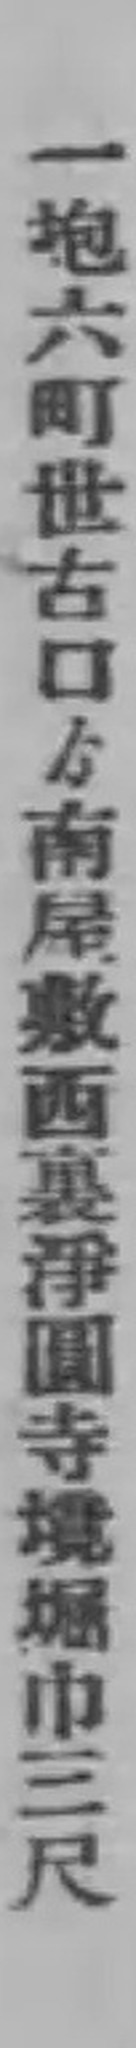一垉六町世古口ゟ南屋敷西裏浄円寺境堀巾三尺
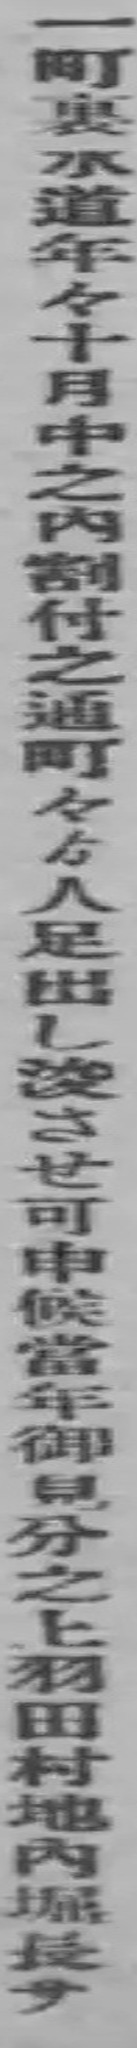一町裏水道年々十月中之内割付之通町々ゟ人足出し浚させ可申候当年御見分之上羽田村地内堀長サ
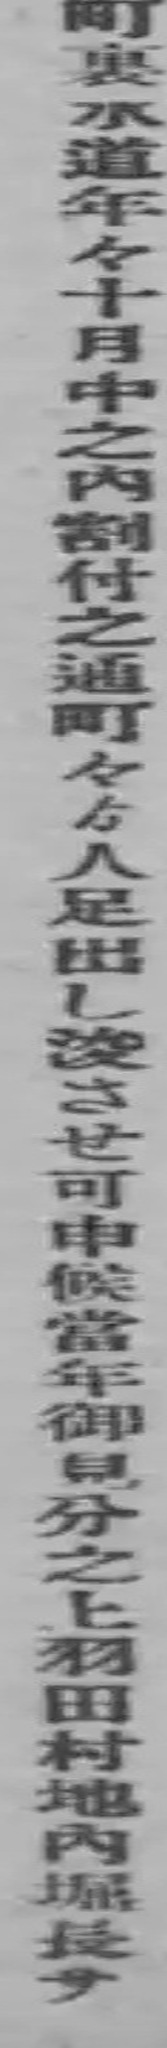一町裏水道年々十月中之内割付之通町々ゟ人足出し浚させ可申候当年御見分之上羽田村地内堀長サ
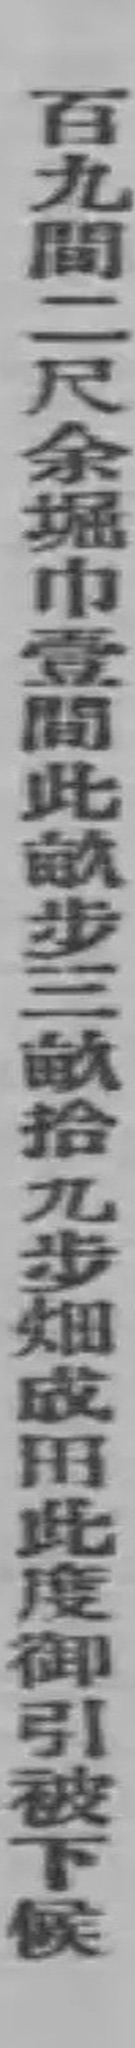百九間二尺余堀巾壱間此畝歩三畝拾九歩畑成田此度御引被下候
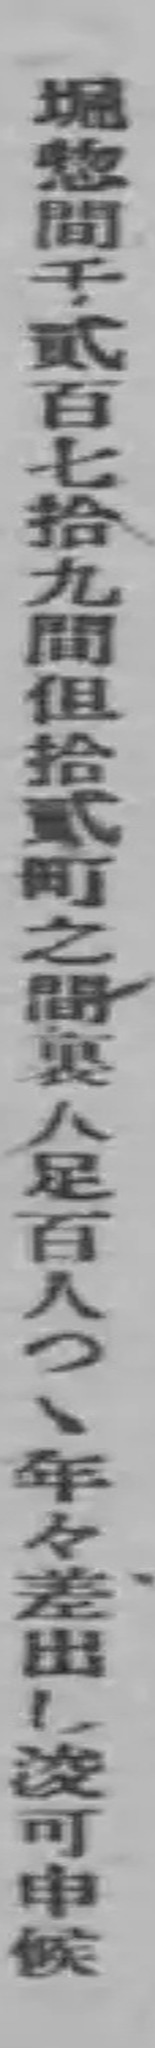堀惣間千弐百七拾九間但拾弐町之間裏人足百人つゝ年々差出し浚可申候
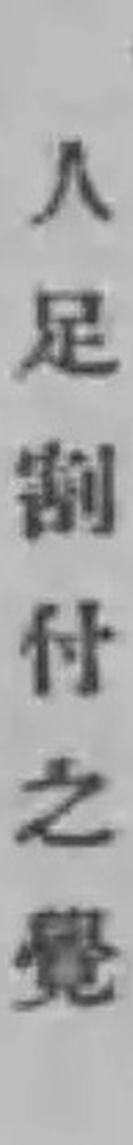人足割付之覚

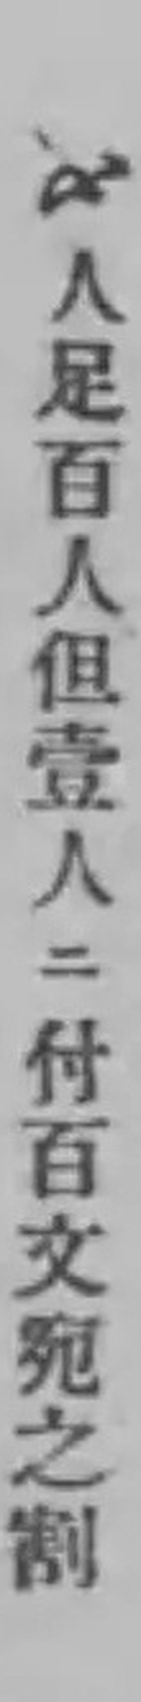〆人足百人但壱人ニ付百文宛之割
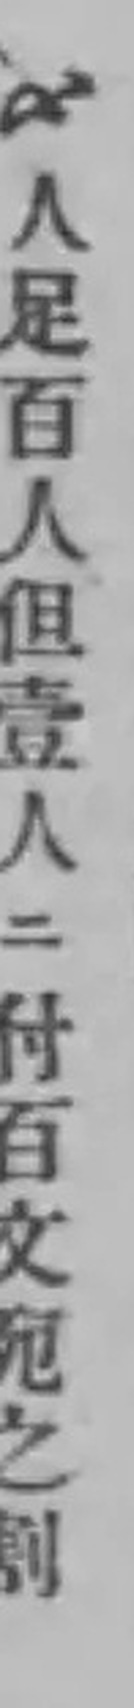〆人足百人但壱人ニ付百文宛之割
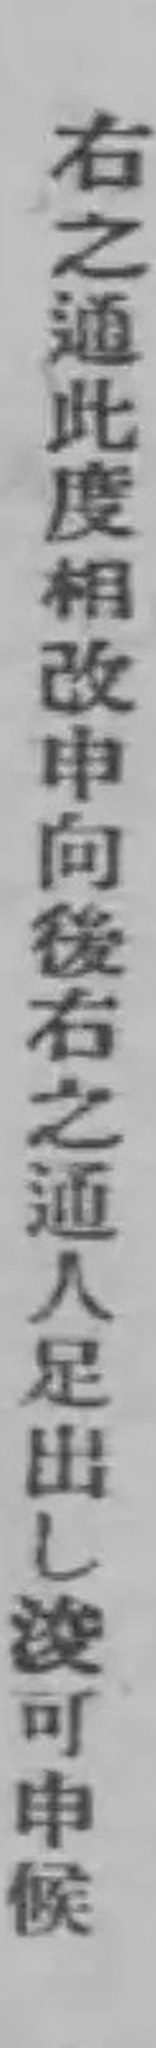右之通此度相改申向後右之通人足出し浚可申候
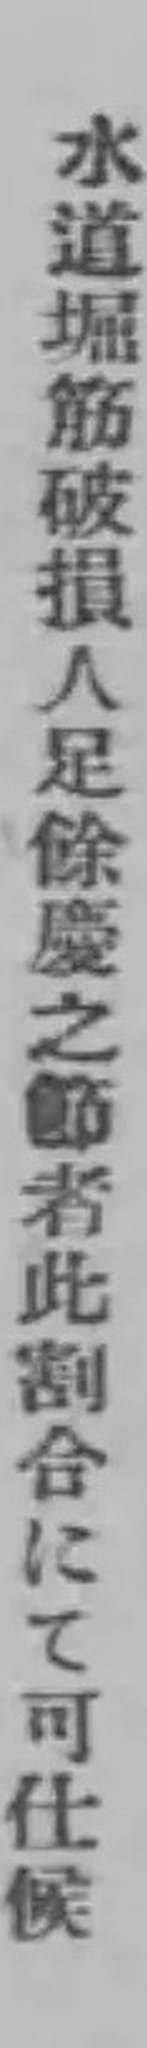水道堀筋破損人足余慶之節者此割合にて可申候
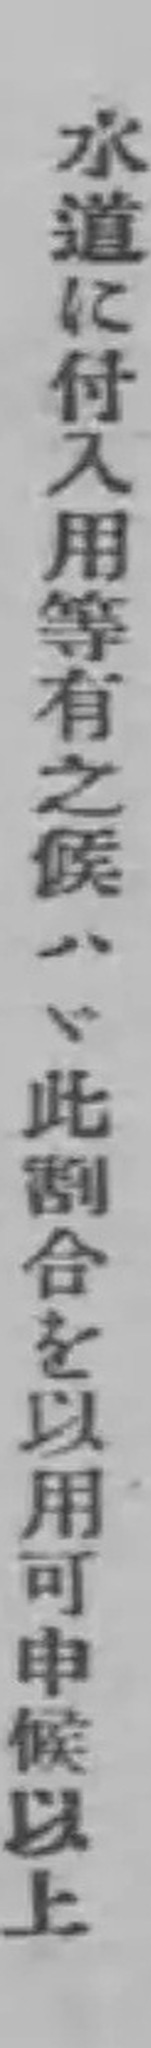水道に付入用等有之候ハヾ此割合を以用可申候以上
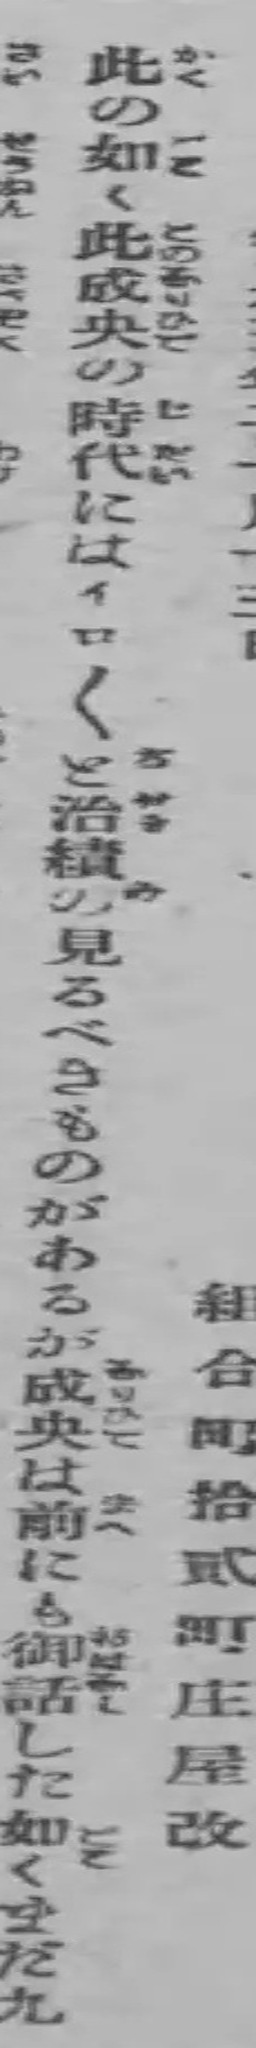此の如く成央の時代にはイロ〳〵と治績の見るべきものがあるが成央は前にも御話した如くまだ九
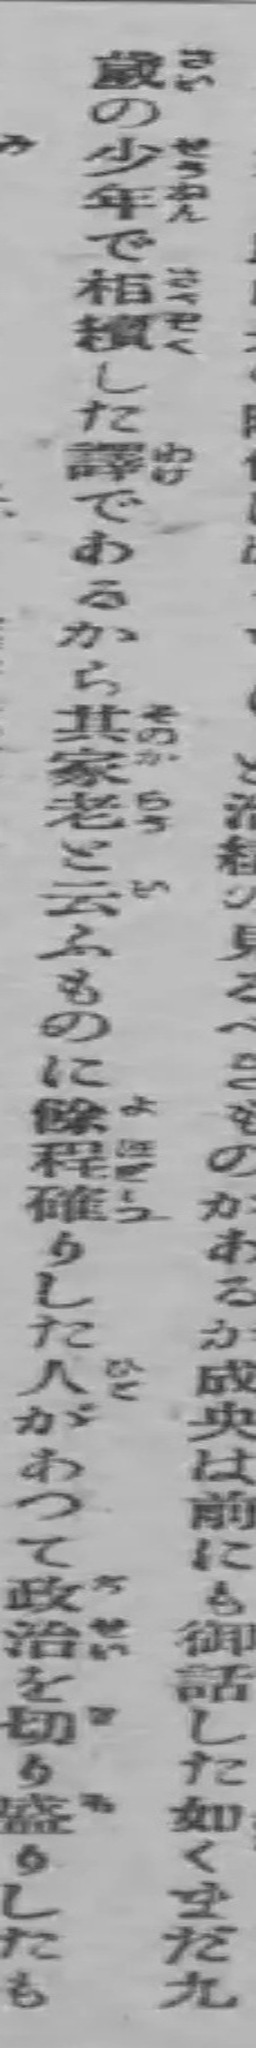歳の少年で相続した訳であるから其家老と云ふものに余程確りした人があつて政治を切り盛りしたも
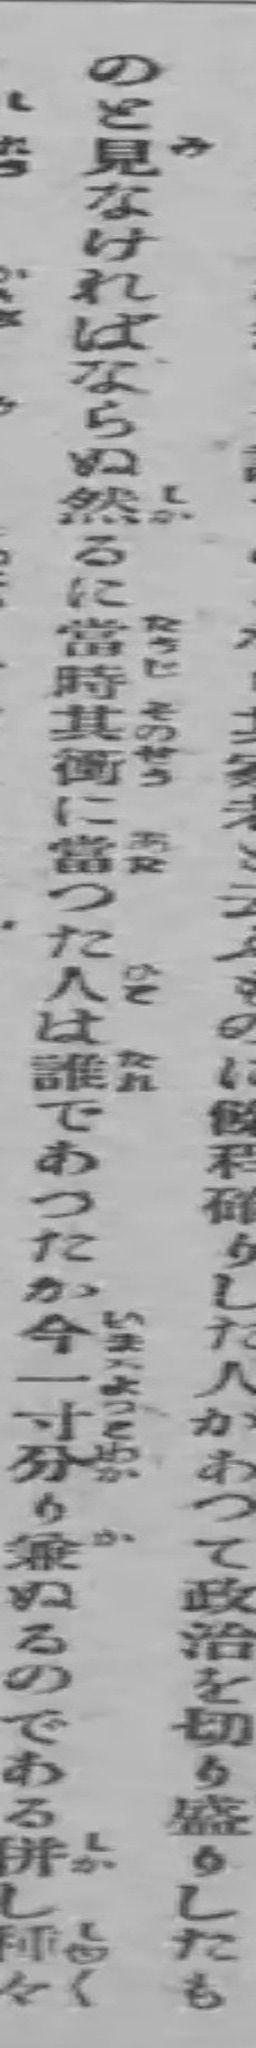のと見なければならぬ然るに当時其衝に当つた人は誰であつたか今一寸分り兼ぬるのである併し種々
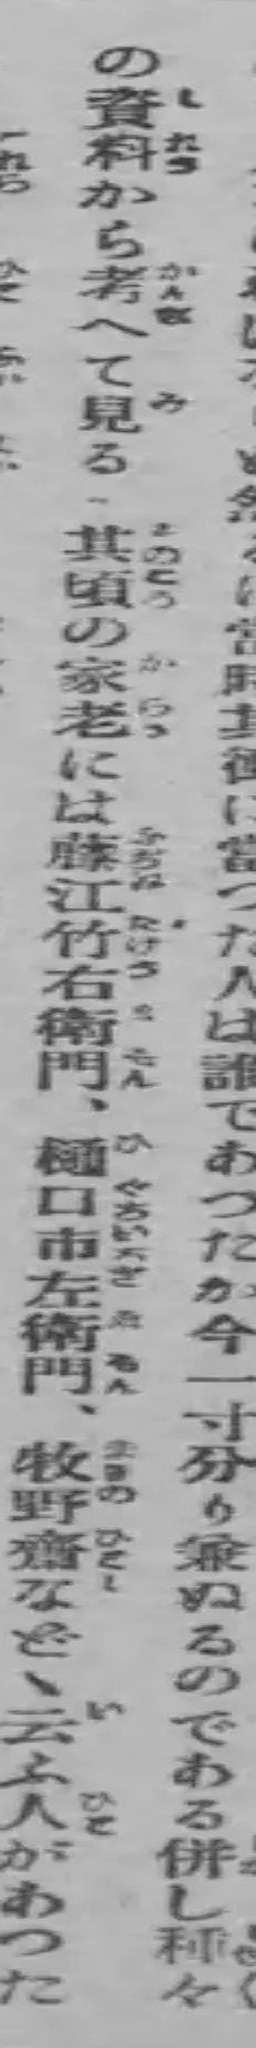の資料から考へて見ると其頃の家老には藤江竹右衛門、樋口市左衛門、牧野斉などゝ云ふ人があつた
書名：豊橋市史談
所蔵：国立国会図書館 National Diet Library, JAPAN
